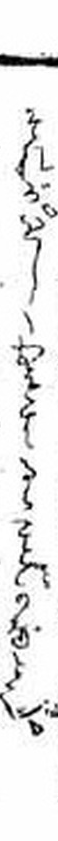それがをしくおもはるゝことかなと也
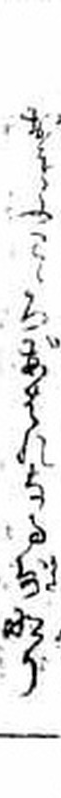をもふこゝろあはれなる哥なり
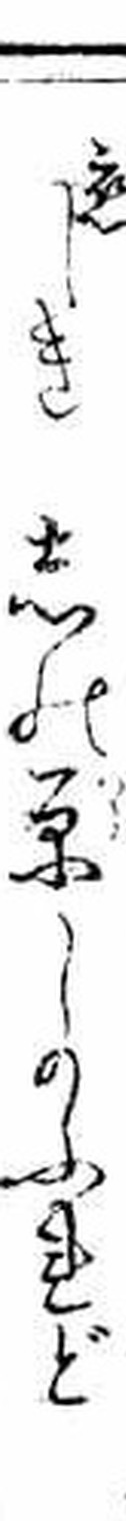しきしの原しのぶれど人の
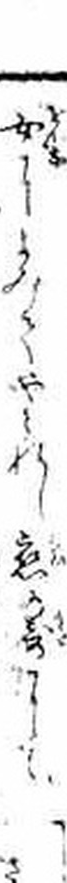女によみてやるへし恋哥にて
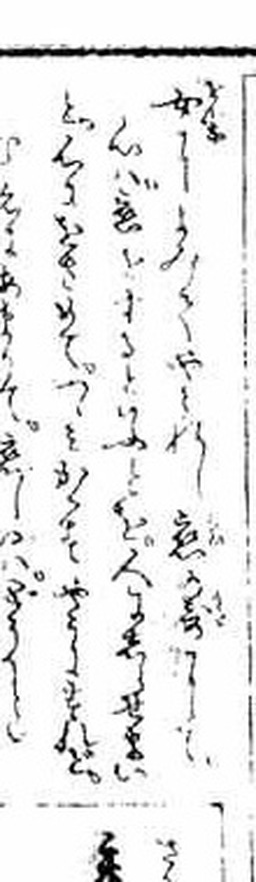心は恋をするといふ事を人にしらせまい参
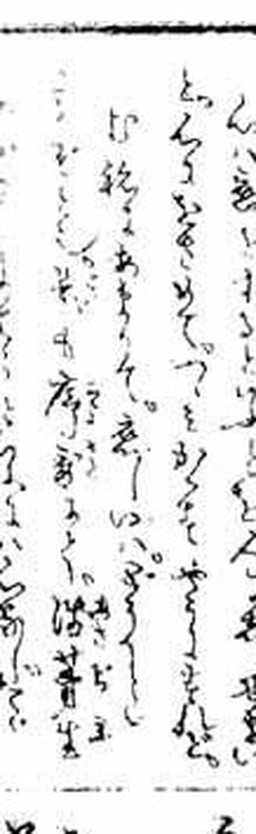むねにあまりて恋しいはどうした
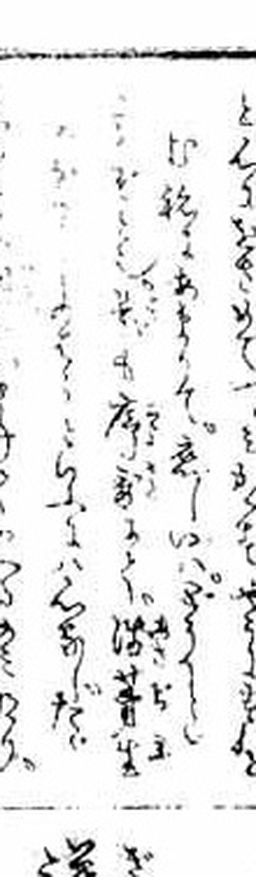ことぞと也これも序詞にて浅茅生
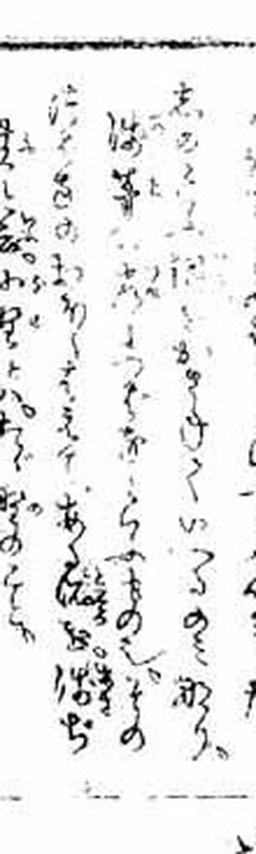浅茅は常につばなといふもの也その
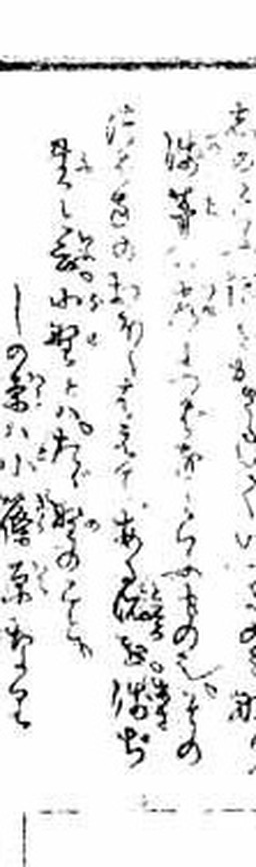つばなのおほくはえてある所を浅ぢ等
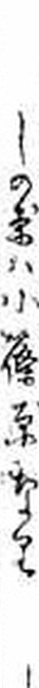しの原とは小篠原なり

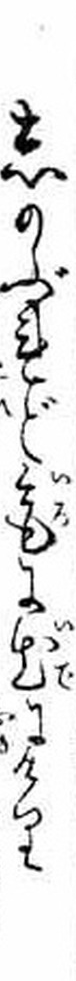しのぶれど色に出にけり
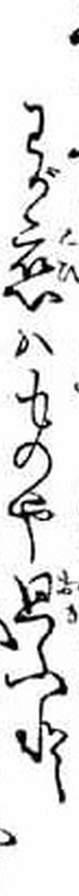わが恋はものや思ふと
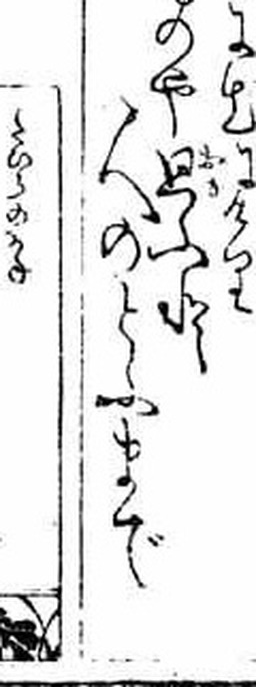人のとふまで
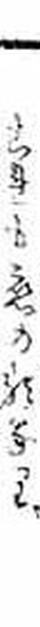これも恋の哥なり
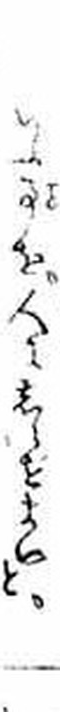いふことを人にしられまいと
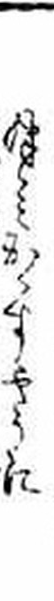つゝみかくすやうに盛
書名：小倉百人一首
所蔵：東京学芸大学教育コンテンツアーカイブ
